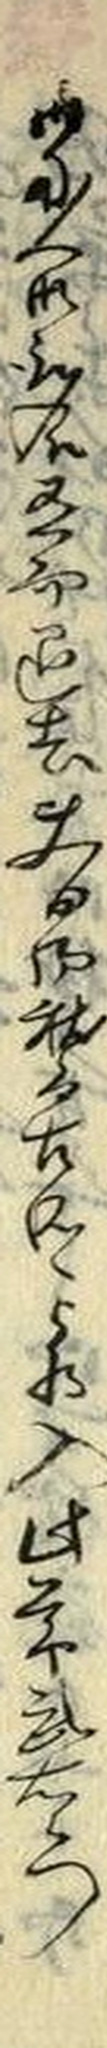御用人御取合有而退去夫ゟ御稽古所へ被為入此節武右衛門
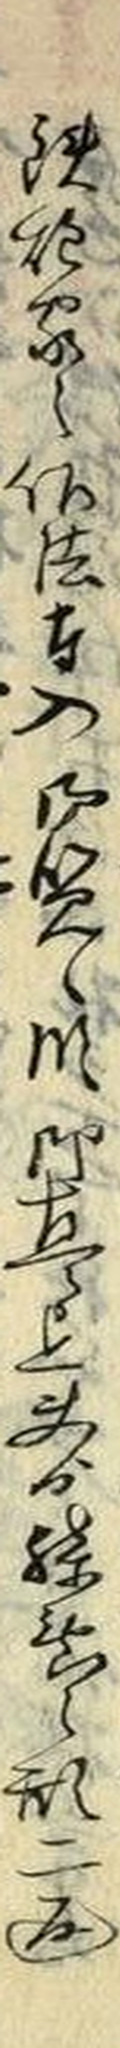鉄炮家之作法奉入御覧候段御直ニ申上夫ゟ膝台之形二通
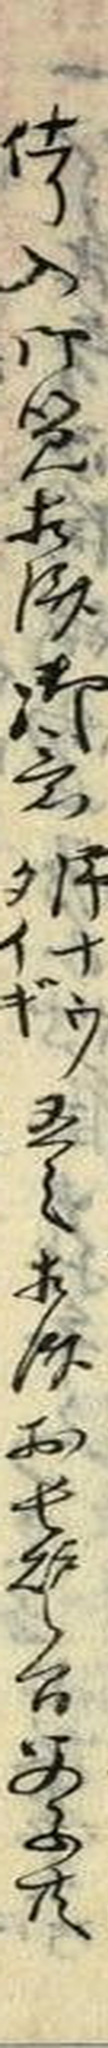タイギ有之相済於長炉之間父子共
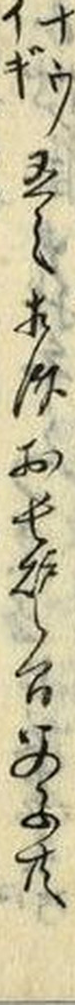タイギ有之相済於長炉之間父子共
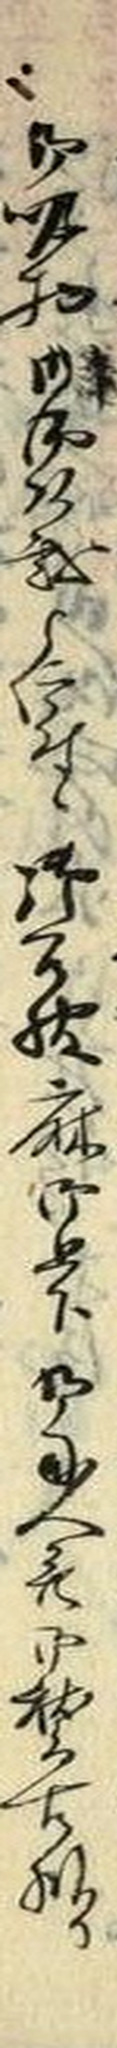御吸物御酒頂戴被仰付候御召服麻御上下御用人幷御稽古掛り
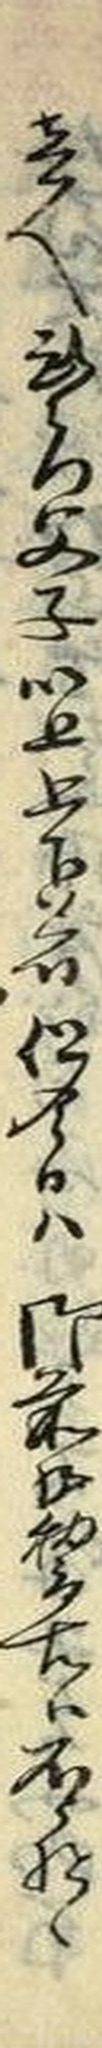壱人武右衛門父子以上上下着但今日ハ御前御稽古ハ不被遊候
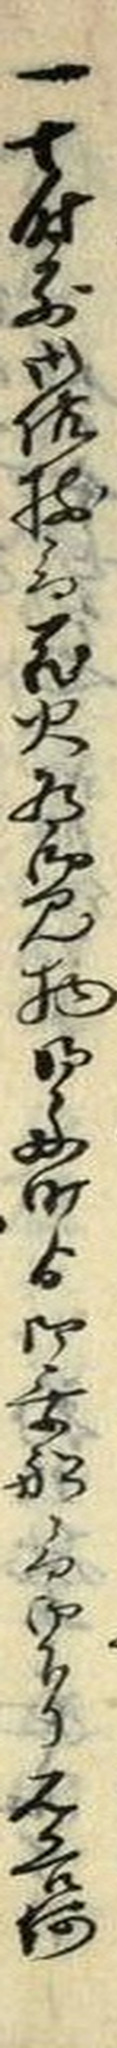一七時前御供揃ニ而花火為御見物御舟町ゟ御乗船ニ而御下り石谷河
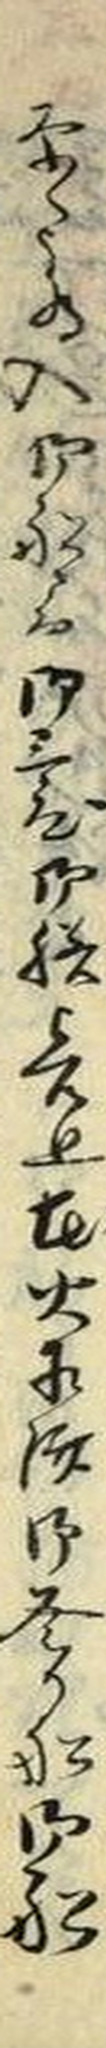原へ被為入御船ニ而御三度御膳被召上花火相済御登り船御船
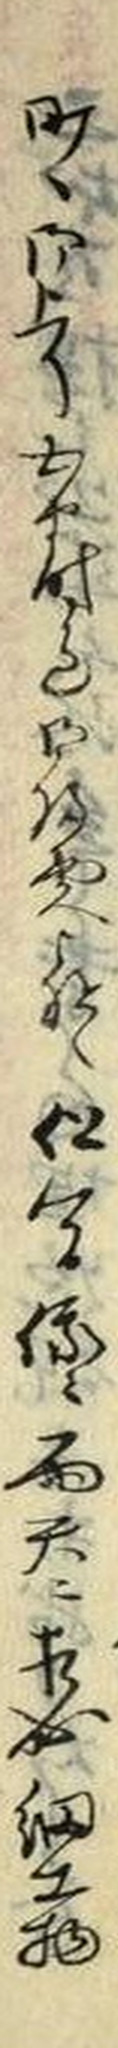町へ御上り五半時過御帰殿被遊候但今日俄ニ雨天ニ相成細工物

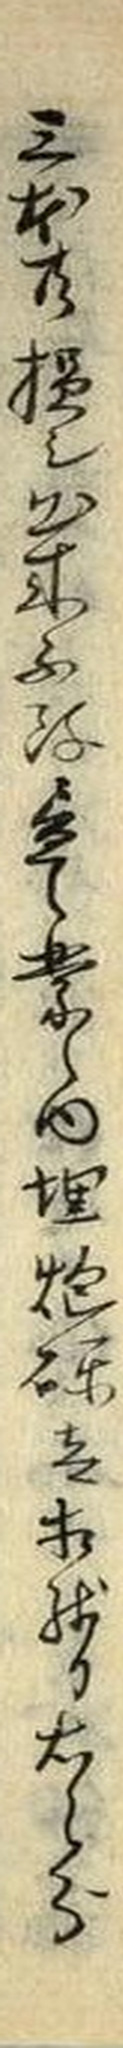三本共損シ出来不致昼之業之内埋炮礫壱相残り右之分
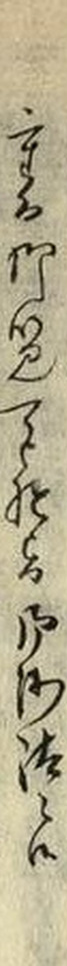重而御覧可被遊旨御沙汰ニ候
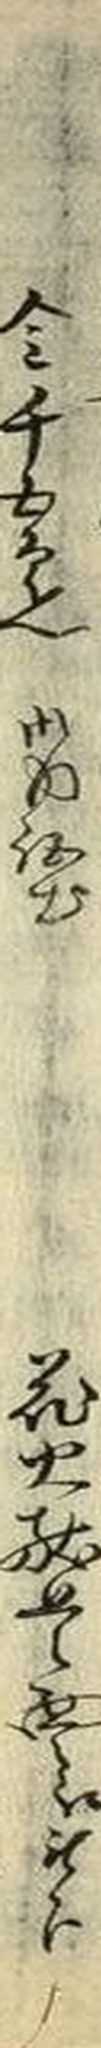金千五百疋御内証出花火献上之面々江被下
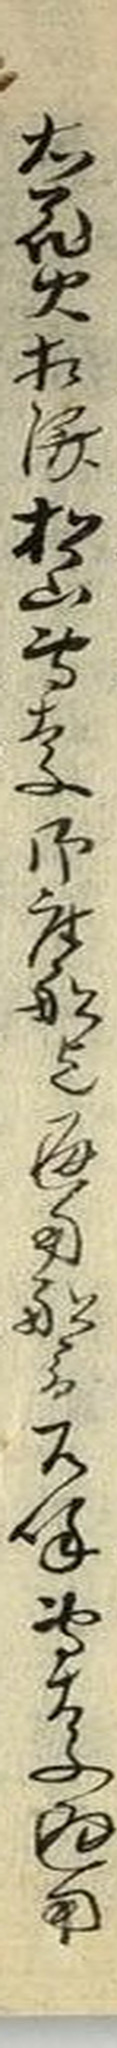右花火相済松山専太夫御座船迄通用船ニ而召呼専太夫通用
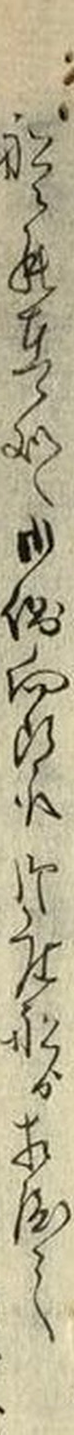船ニ罷在候処へ御側向頭取御座船ゟ相渡之
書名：少傅日録抄（斉承付側向頭取日記、在国）
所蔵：福井県文書館 Fukui Prefectural Archives
